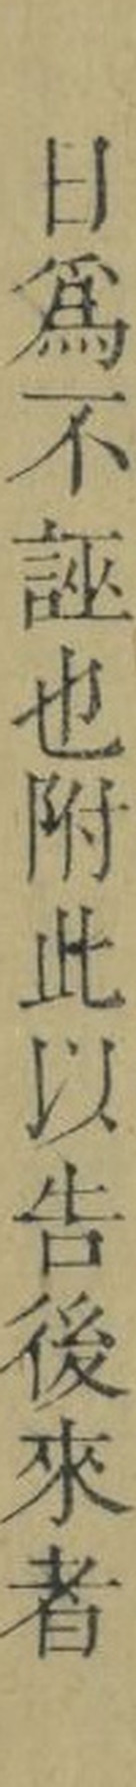日爲不誣也附此以告後來者
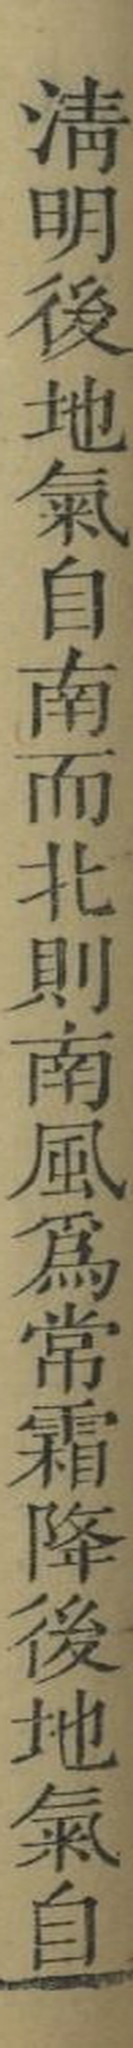淸明後地氣自南而北則南風爲常霜降後地氣自
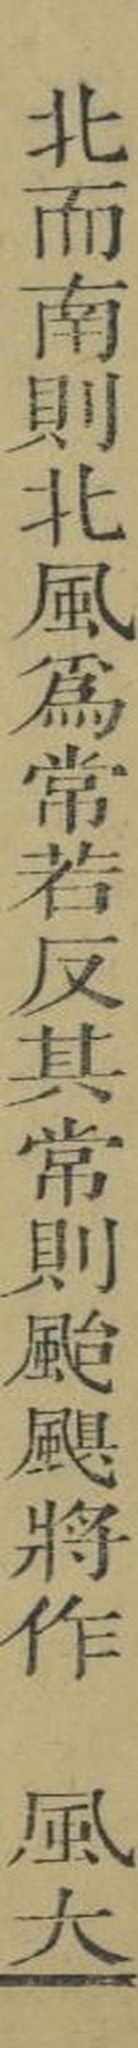北而南則北風爲常若反其常則颱颶將作風大
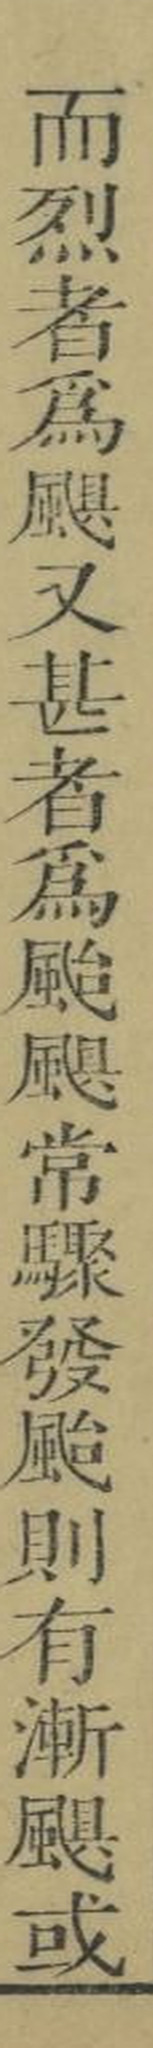而烈者爲颶又甚者爲颱颶常驟發颱則有漸颶或
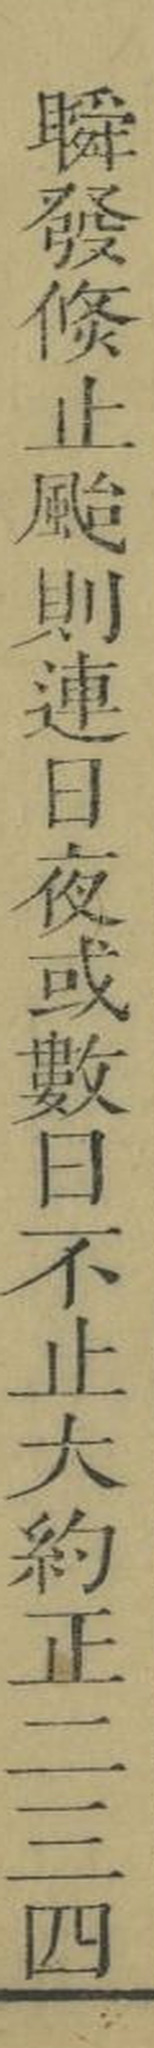瞬發焂止颱則連日夜或數日不止大約正二三四
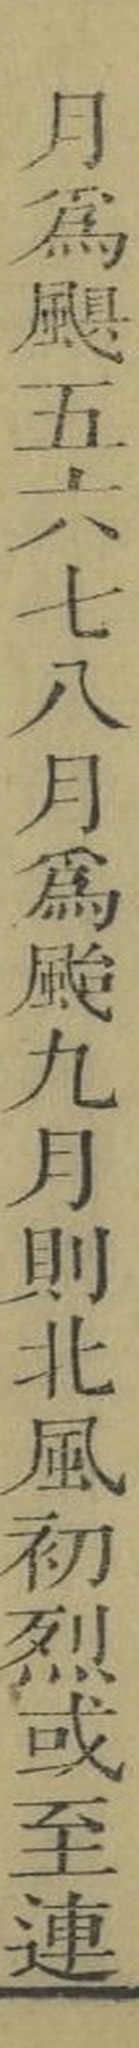月爲颶五六七八月爲颱九月則北風初烈或至連
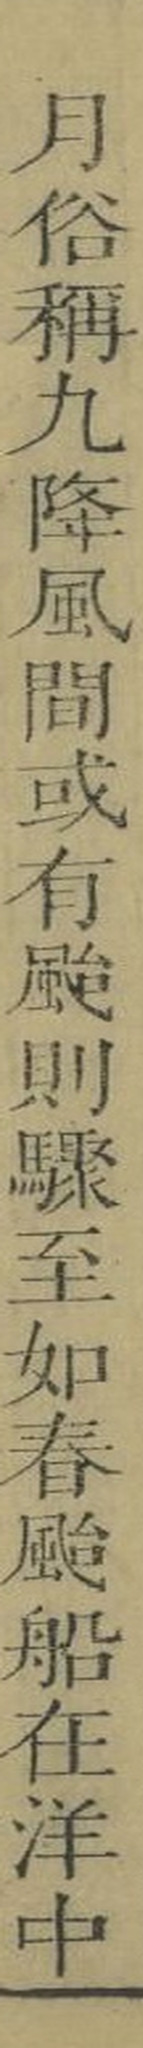月俗稱九降風間或有颱則驟至如春颱船在洋中
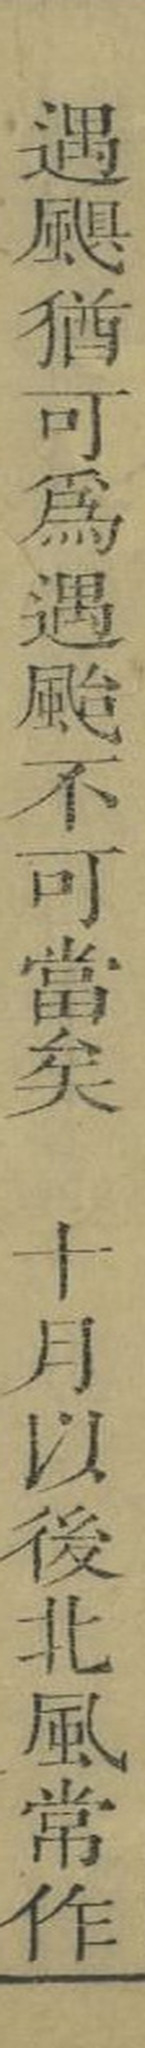遇颶猶可爲遇颱不可當矣十月以後北風常作
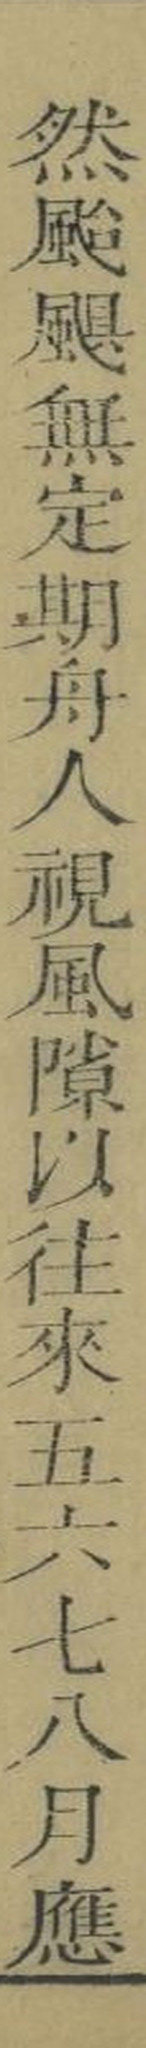然颱颶無定期舟人視風隙以往來五六七八月應
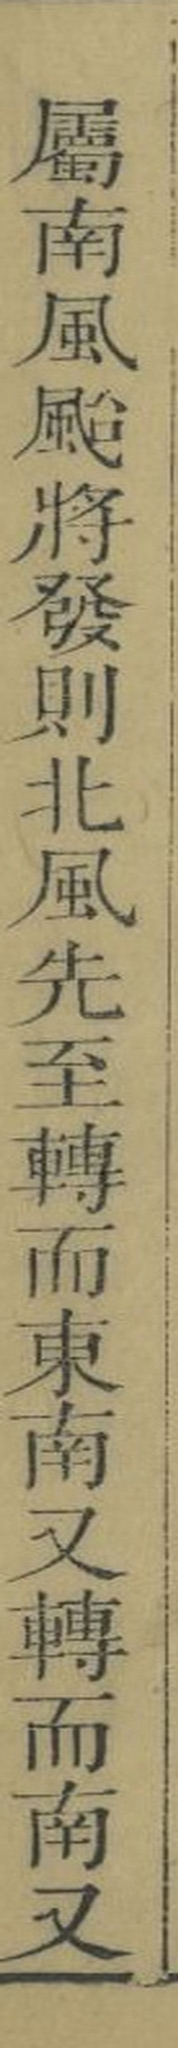屬南風颱將發則北風先至轉而東南又轉而南又

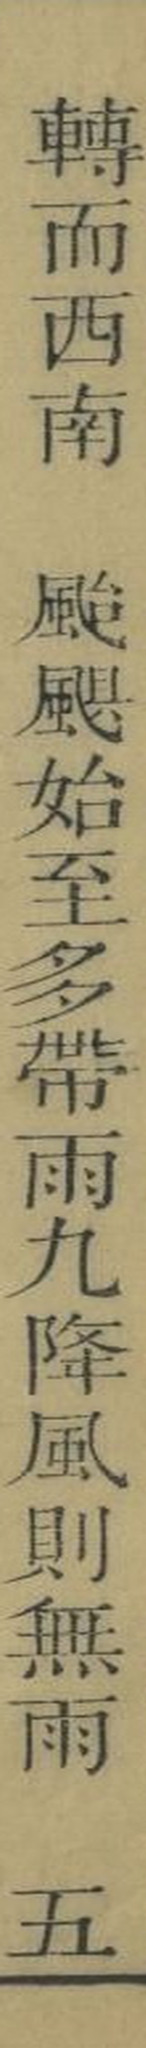轉而西南颱颶始至多帶雨九降風則無雨五
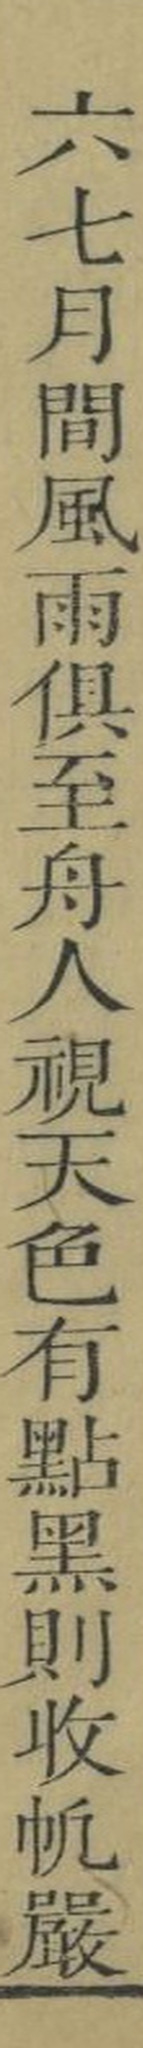六七月間風雨俱至舟人視天色有點黑則收帆嚴
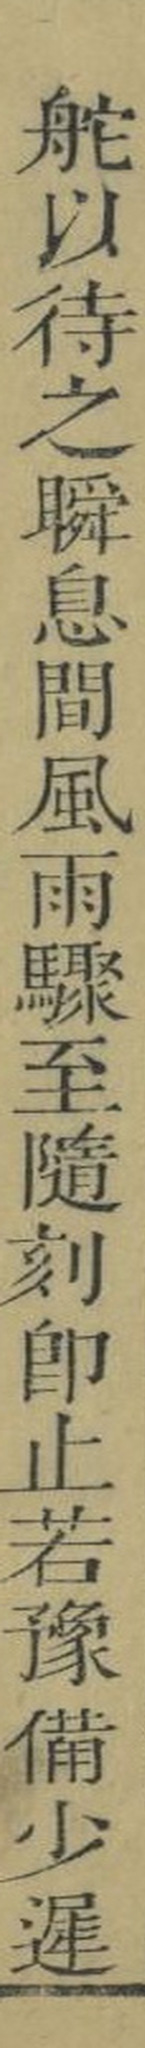舵以待之瞬息間風雨驟至隨刻卽止若豫備少遲
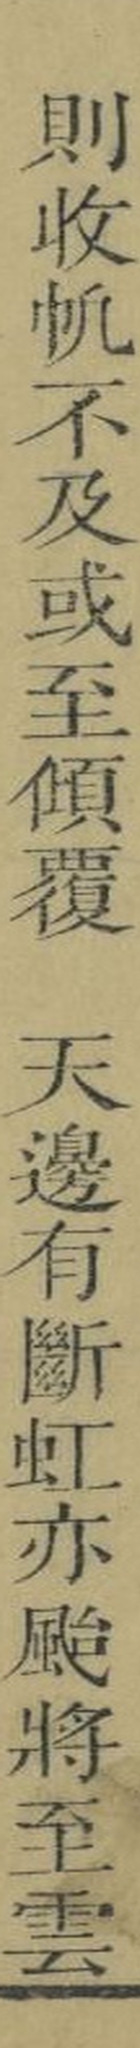則收帆不及或至傾覆天邊有斷虹亦颱將至雲
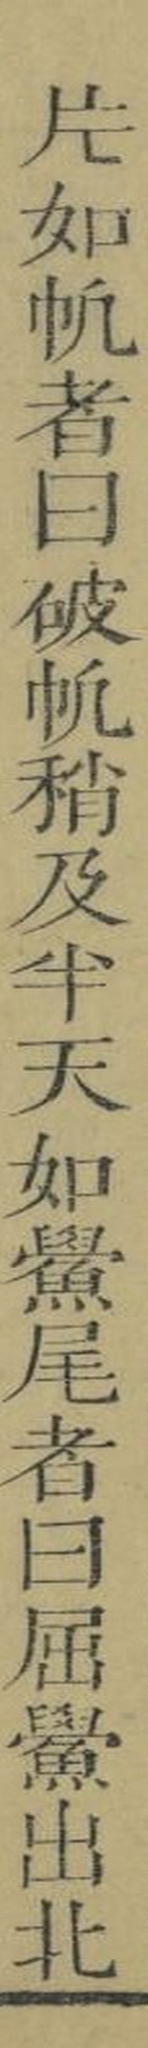片如帆者曰破帆稍及半天如鱟尾者曰屈鱟出北
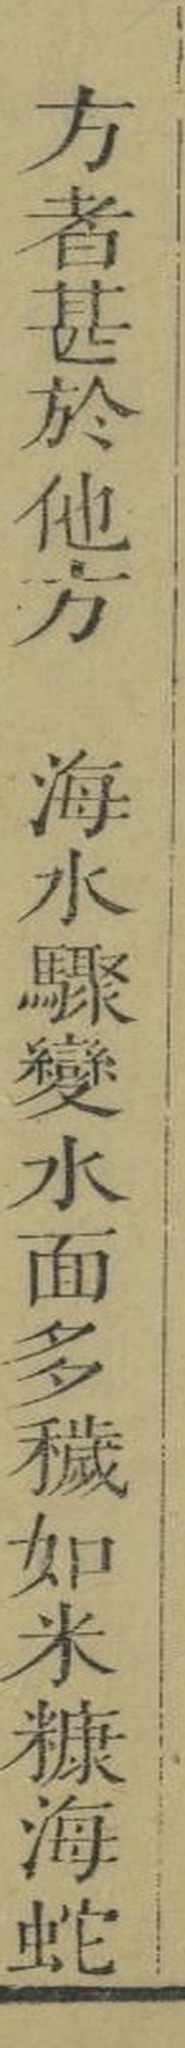方者甚於他方海水驟變水面多穢如米糠海蛇
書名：中山伝信録 巻一
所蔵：University of the Ryukyus Library
